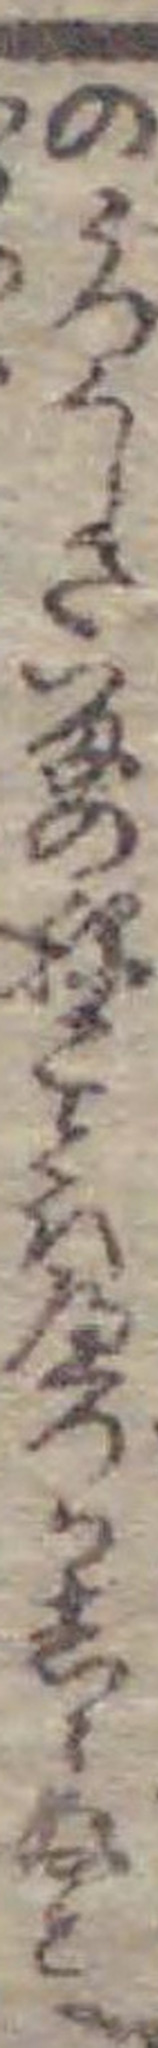のうつくしさいまのねことはへつかしらぬと
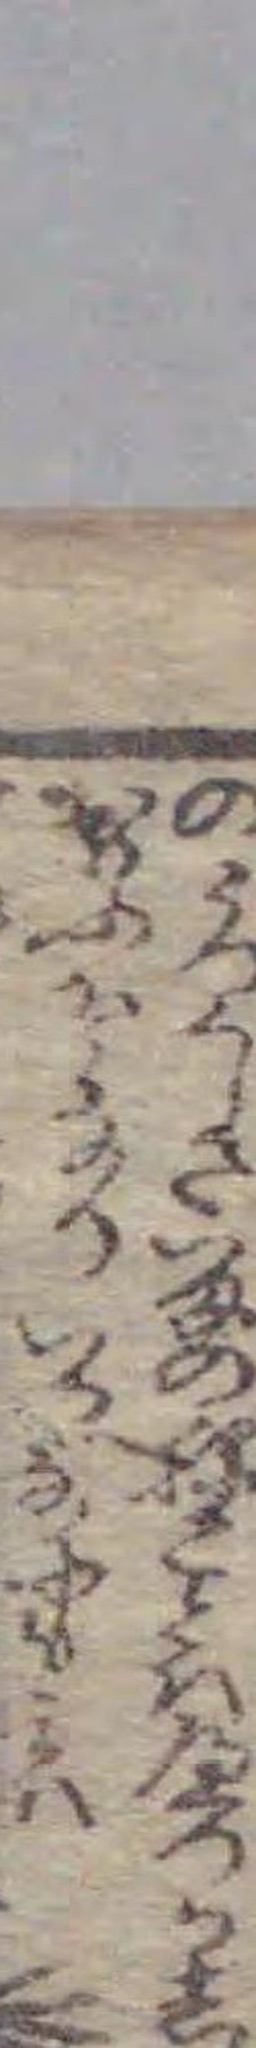おもふほかなりいなにもみは
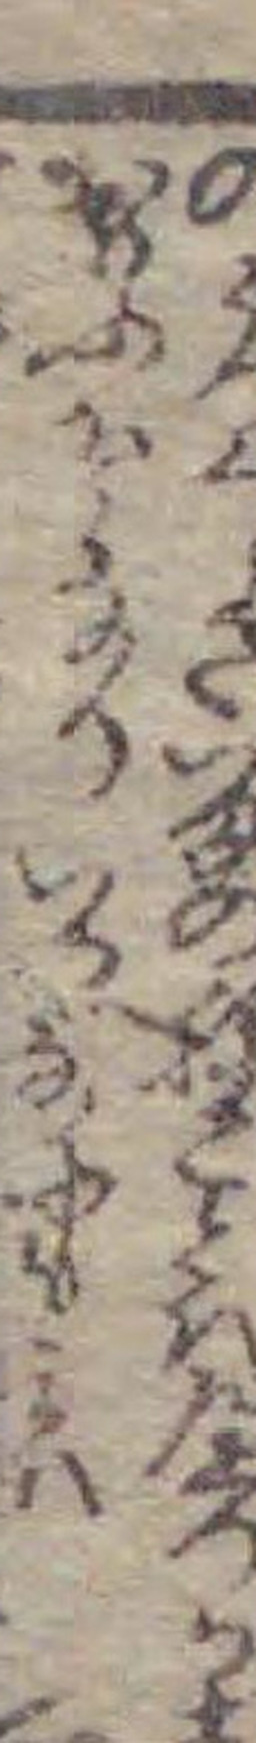おもふほかなりいなにもみは
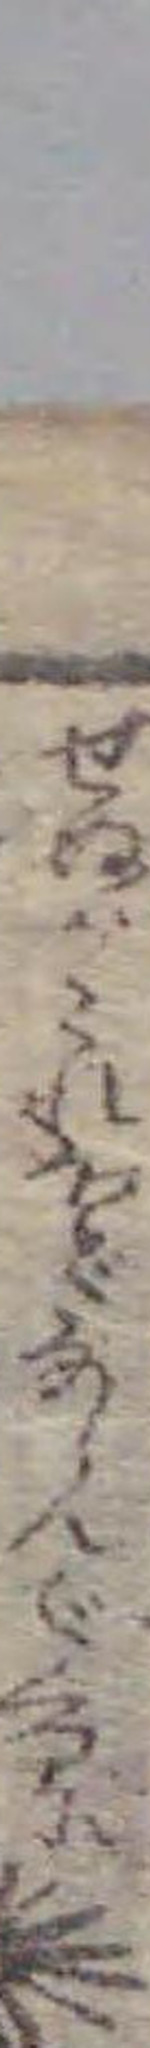せぬかこれほどならんでくるふ
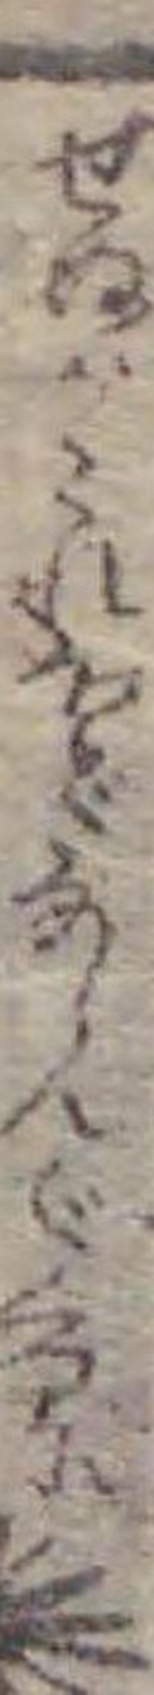せぬかこれほどならんでくるふ
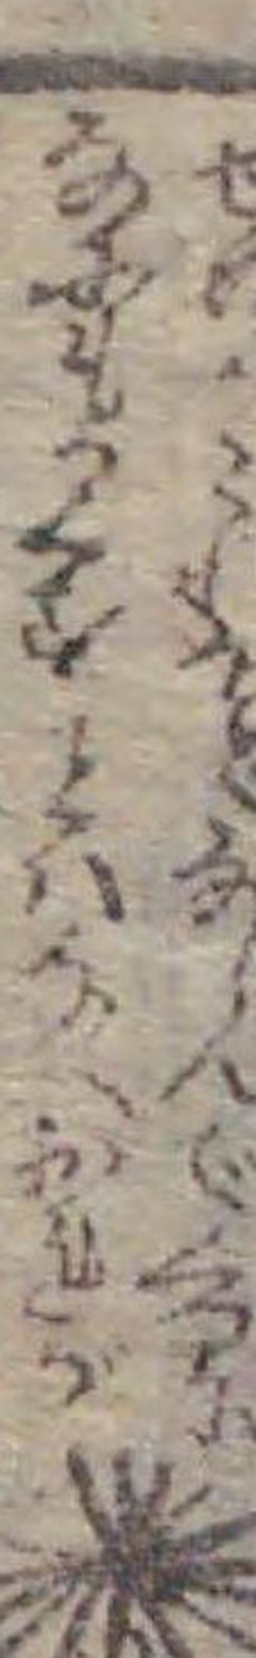なにもかくすことはおれが
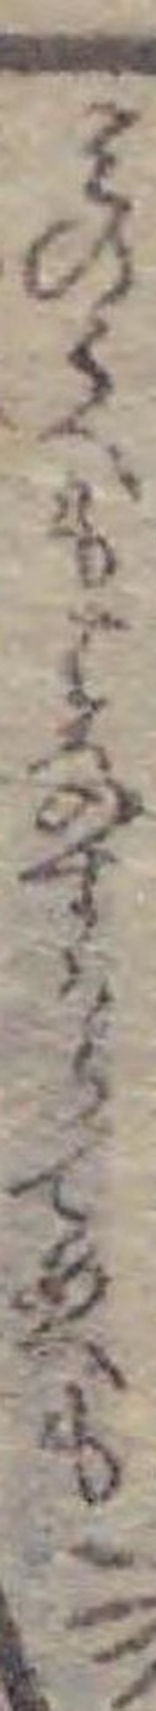みのうへもはなすからてめへも
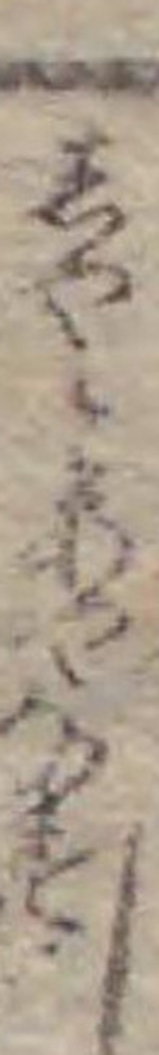しやとあやなす
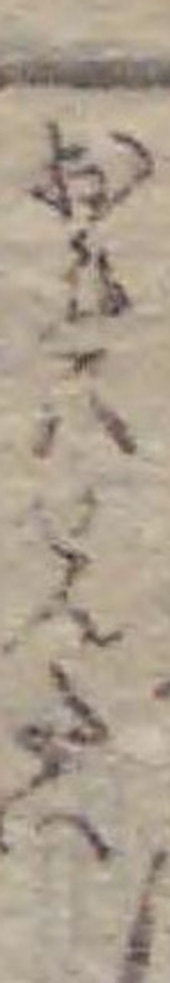おれはせんたい
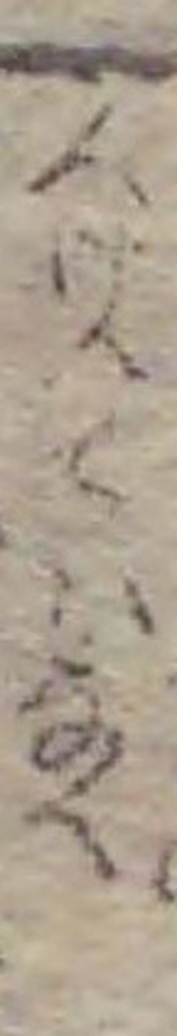人けんてはなく
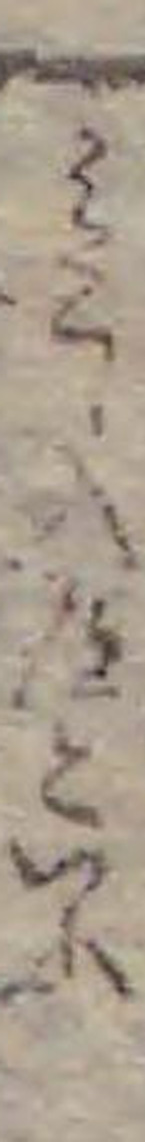みこし入道といふ
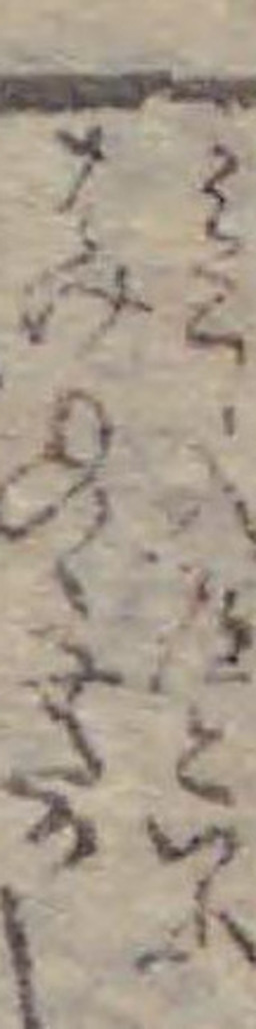はけものゝ子たか
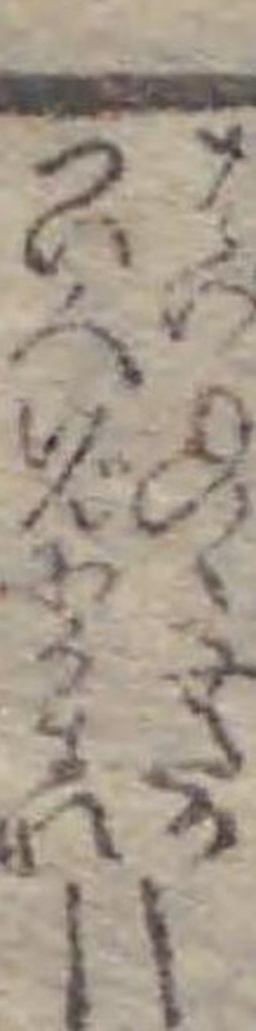つい人げんにうまれ
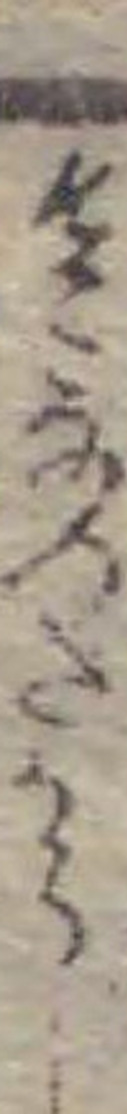そこなつたから
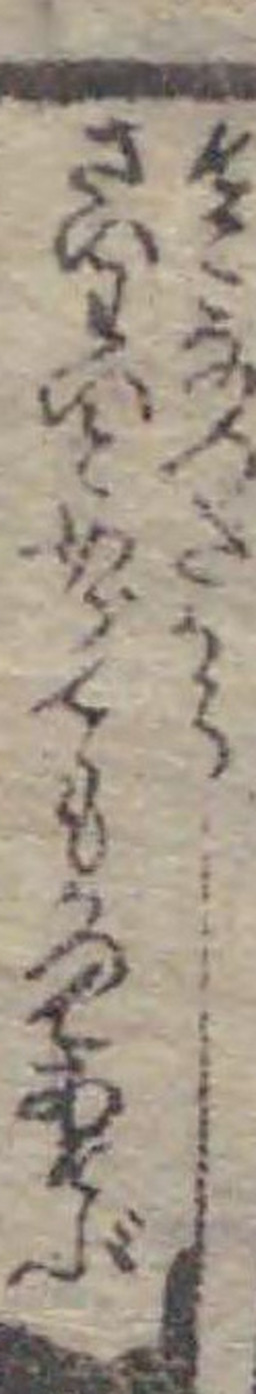さいわいと女郎でもかつてあそぶ
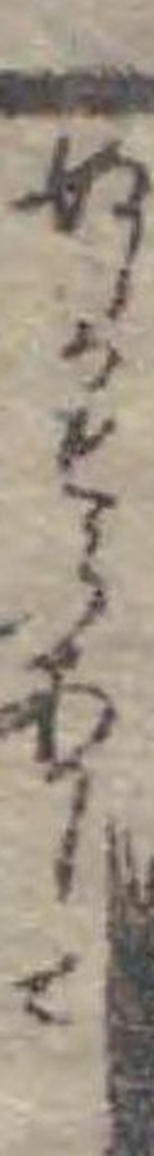ぬしかとうありて
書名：[化物一代記] : 5巻
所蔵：国立国会図書館 National Diet Library, JAPAN
